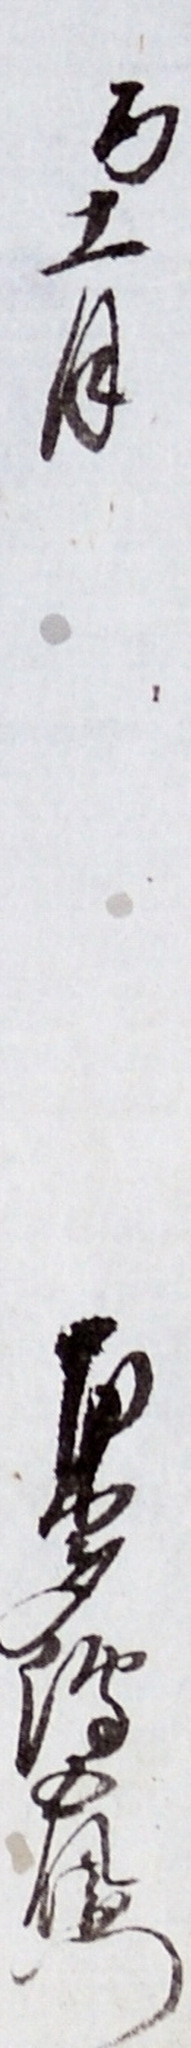酉十一月本多源五左衛門
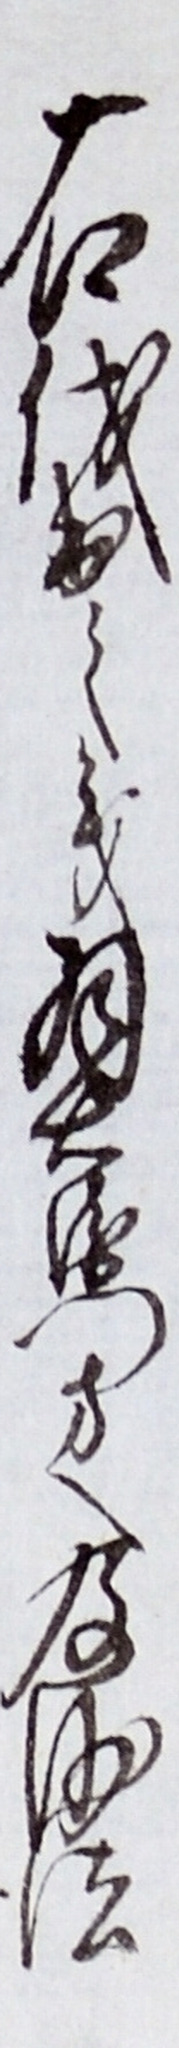右伐出之義羽右衛門方へ及沙汰
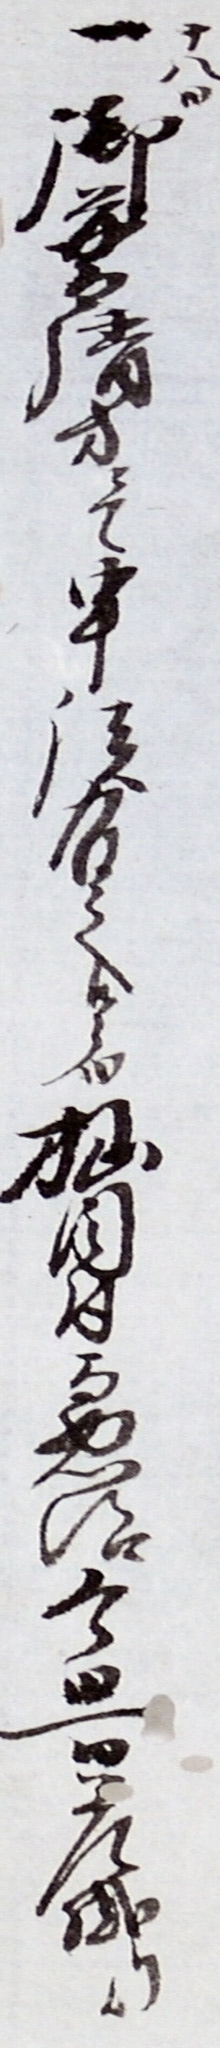一御普請方ニて申談有之候而杣目付勇治今旦日差掛ヶ候
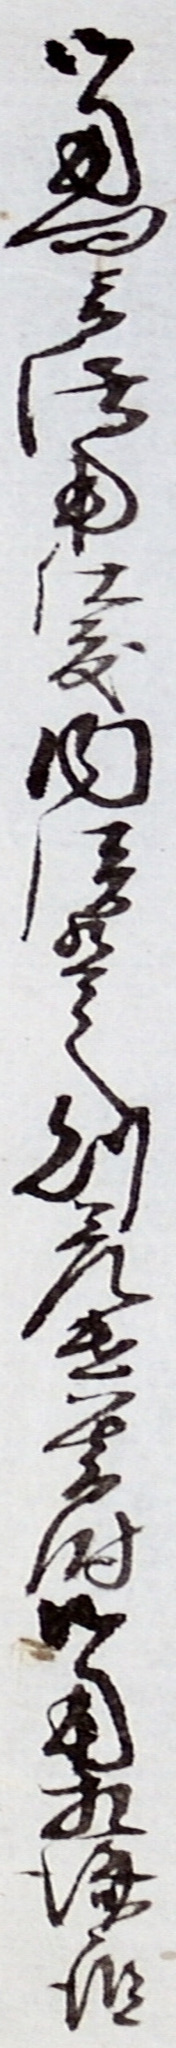御用向ニ而活用仕度内談有之則差遣暮附御用相済候段
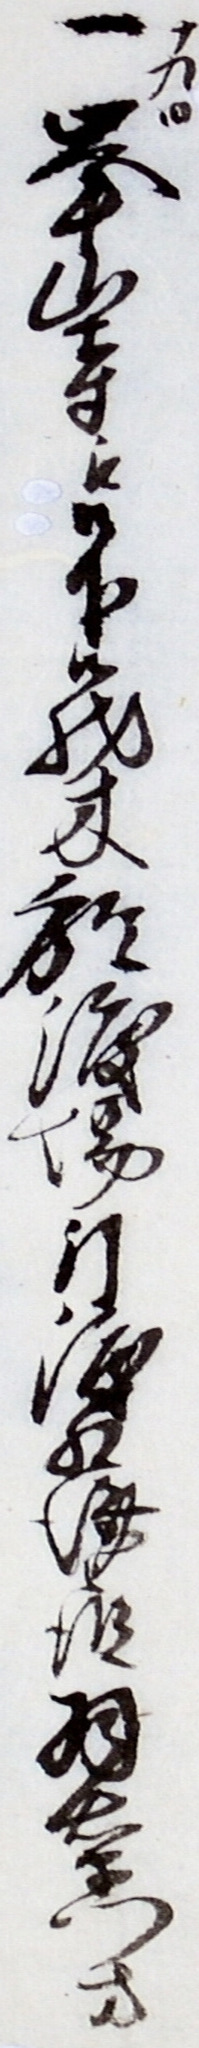一峯山寺江被下候材木於渡場引渡相済候様羽右衛門方
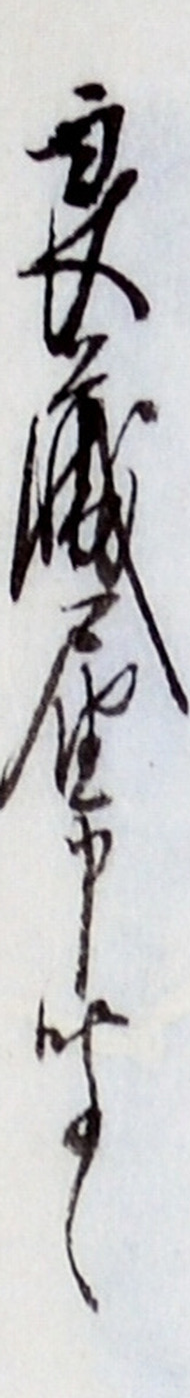良蔵届申聞候
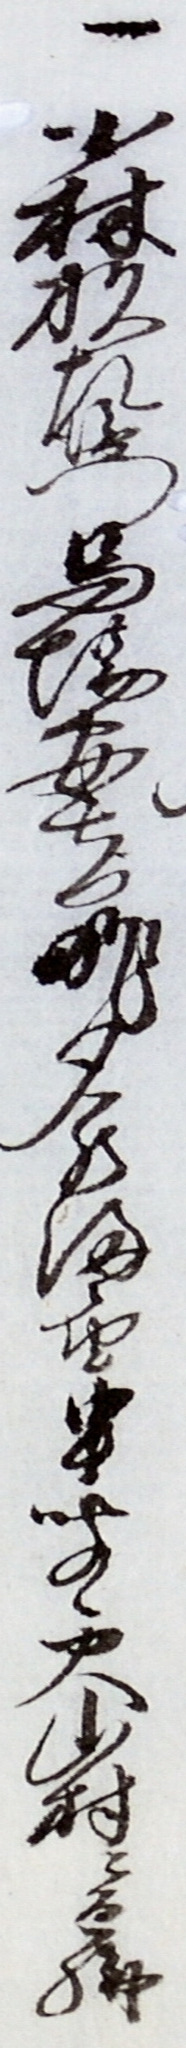小林杉左衛門馬場安右衛門昨夕罷帰届申聞候火山村ニ而払
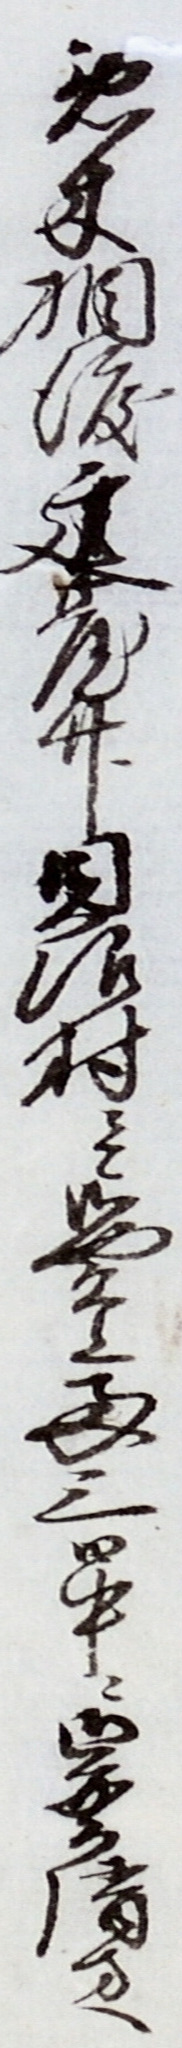惣木相渡建台竹貝沼村ニて御や両三日中ニ御普請方へ
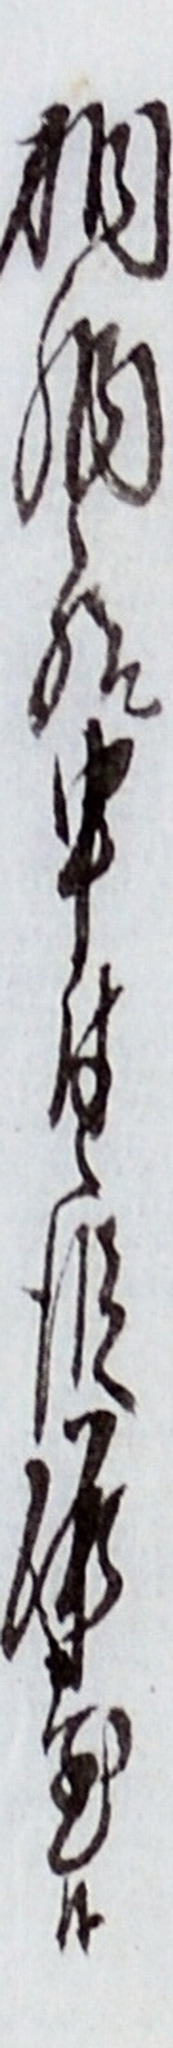相納候様申付候段承置候
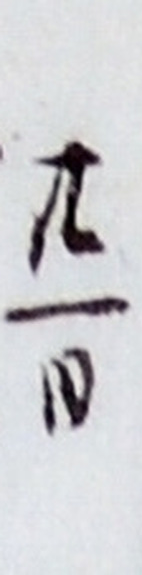廿一日
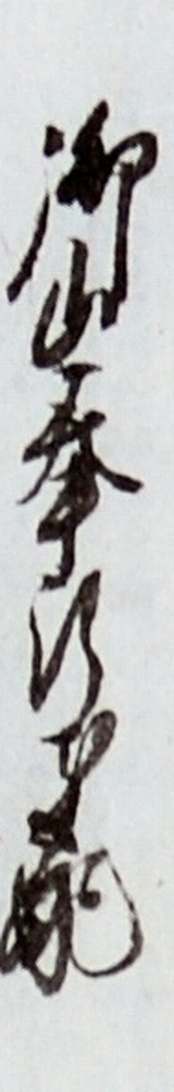御山奉行支配
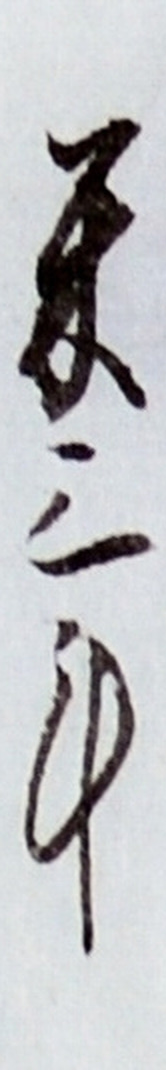米三斗
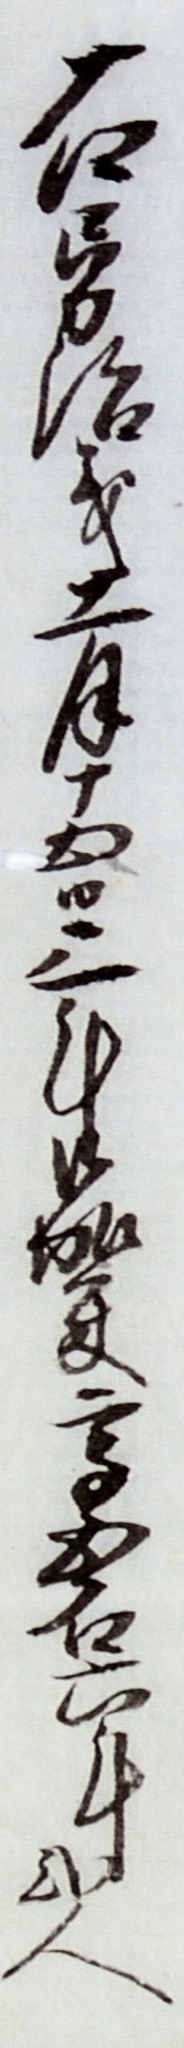右勇治義十一月十五日三斗御加米高五石六斗弐人

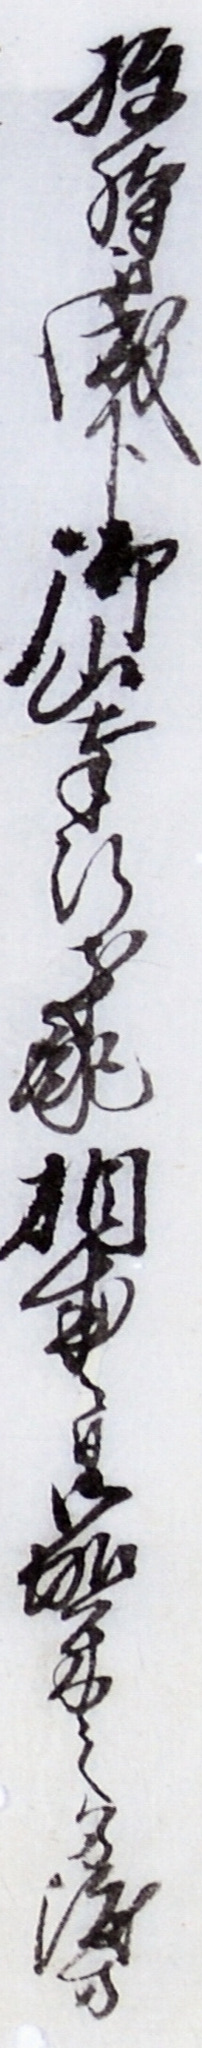扶持被成下御山奉行支配相成ニ付御加米之方渡方
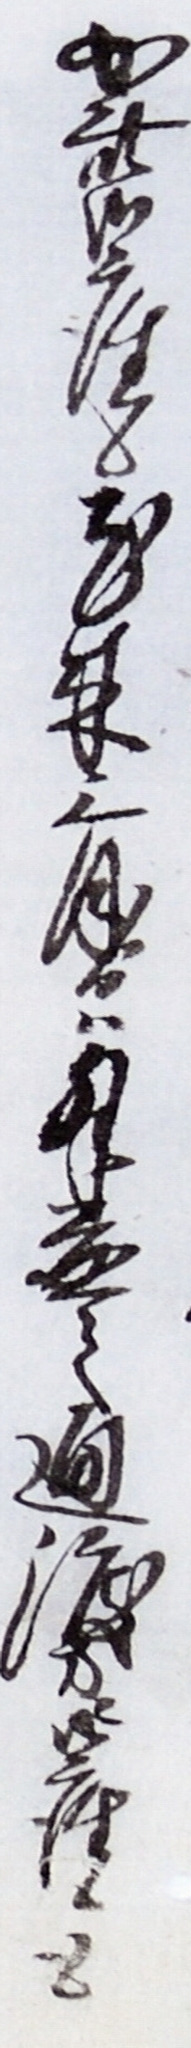如此御座候尤来三月よりハ外台之通渡方ニ御座候も
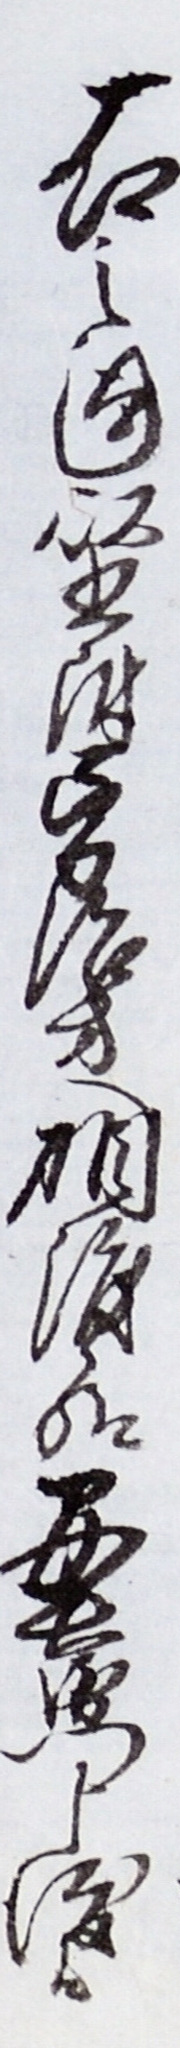右之趣以書附勇治方相済候様安兵衛申渡候
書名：御山奉行御用控
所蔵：伊那市立高遠町図書館・合同会社AMANE
